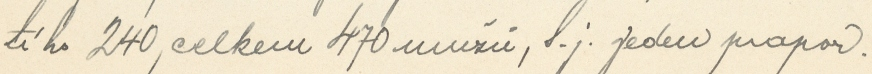tího 240, celkem 470 mužů, t. j. jeden prapor.
